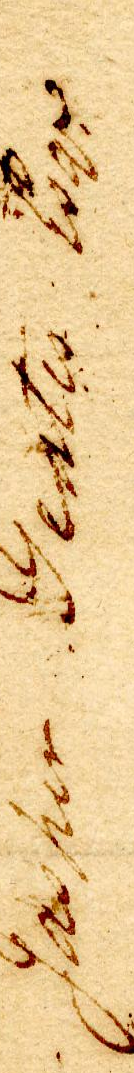Jasper Yeates Esq^r.
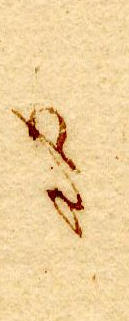at
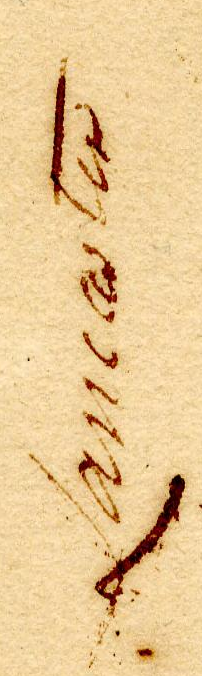Lancaster
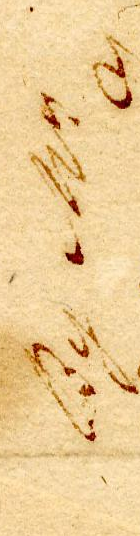By M^r.
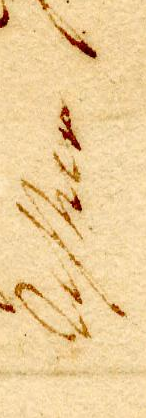Fisher
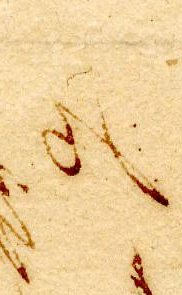J
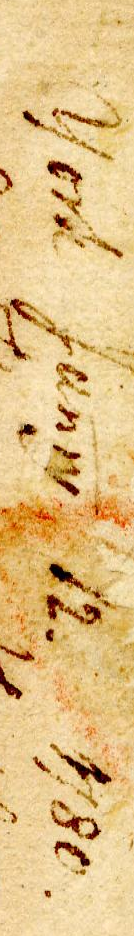York Janry 12. 1780.
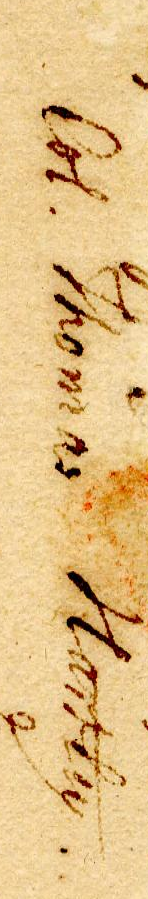Col. Thomas Hartley.
